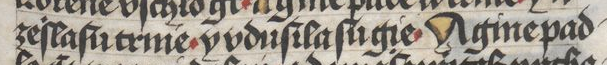zeẛlaſu trnie.y vduſila ſu gie.A gine pad¬
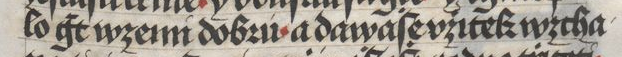lo ḡt wzenni dobrú a dawaẛe vżitek wzcha¬
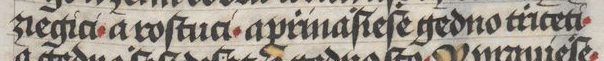ziegici.a roſtucí.a pṙínaẛíeſe gedno tṙiceti.
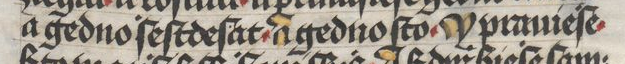gedno ẛeſtdeſaṫ.A gedno ſto.Y prauíeẛe.
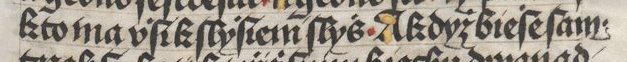kto ma vẛi k ſlyẛienu ſlyṡ.Akdyż bíeẛe ſam.
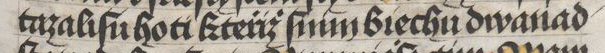tazaliſu hoti kteṙiž ſnim bíechu dwanad¬
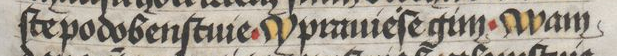ſte podobenſtuíe.Y prauíeẛe gím.Wam
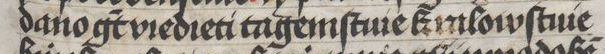dáno ḡt viedieti tagemſtuie kralowſtuíe
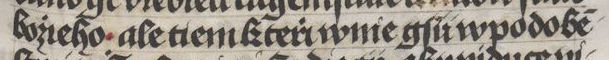bożieho.ale tiem kteṙi wnie gſú wpodobē¬
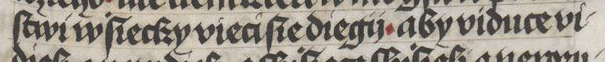ſtwí wẛiecky vieci ſie diegij.aby viduce vi¬
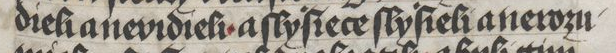dieli a nevidieli.a ſlyẛíece ſlyẛieli a nerozu¬
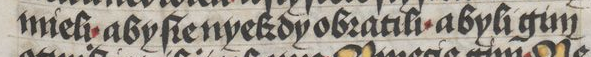mieli.aby ſie nyekdy obratili.a byli gim
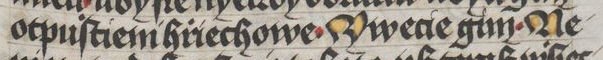otpuẛtieni hṙíechowe.Y wecie gim.Ne¬
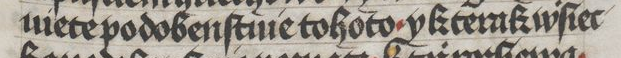uíete podobenſtuíe tohoto.y kteraik wẛiec¬
